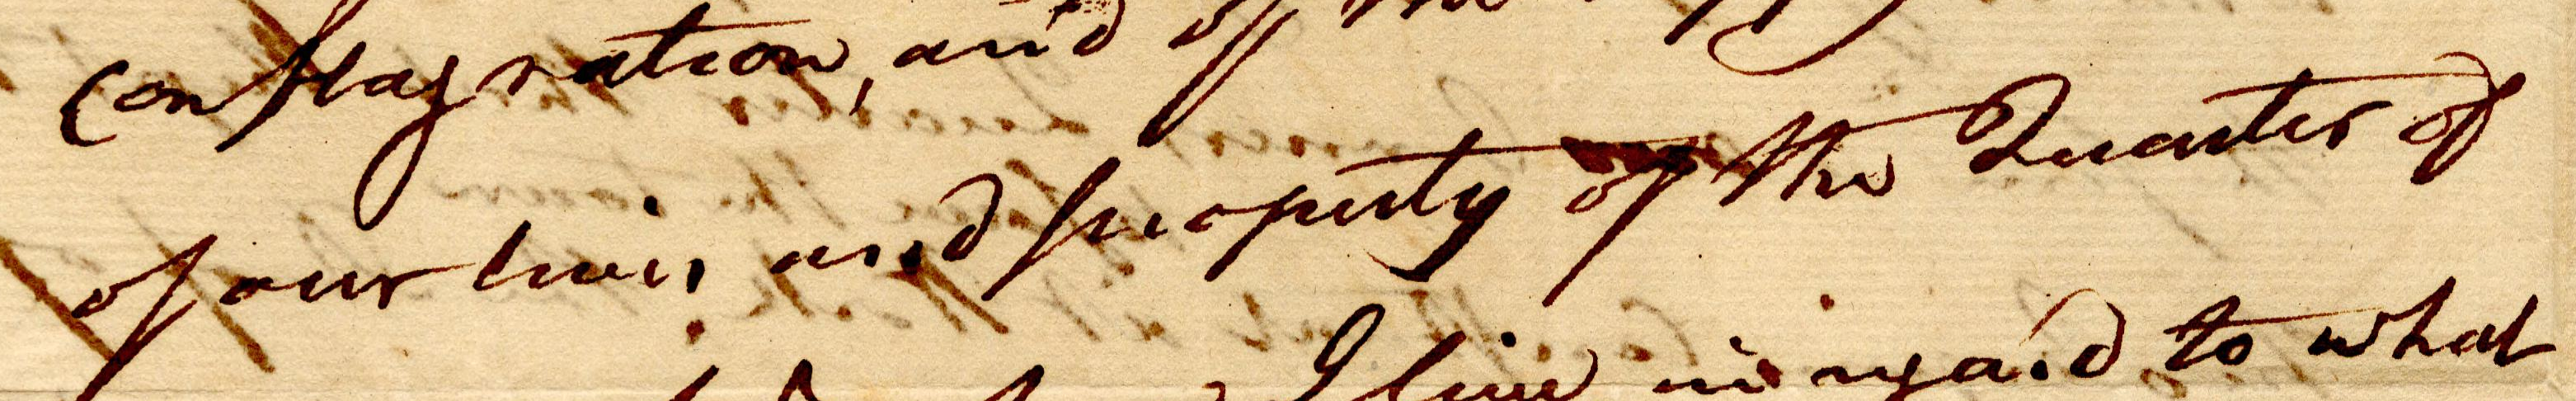of our ties and prosperity of the Lancaster of
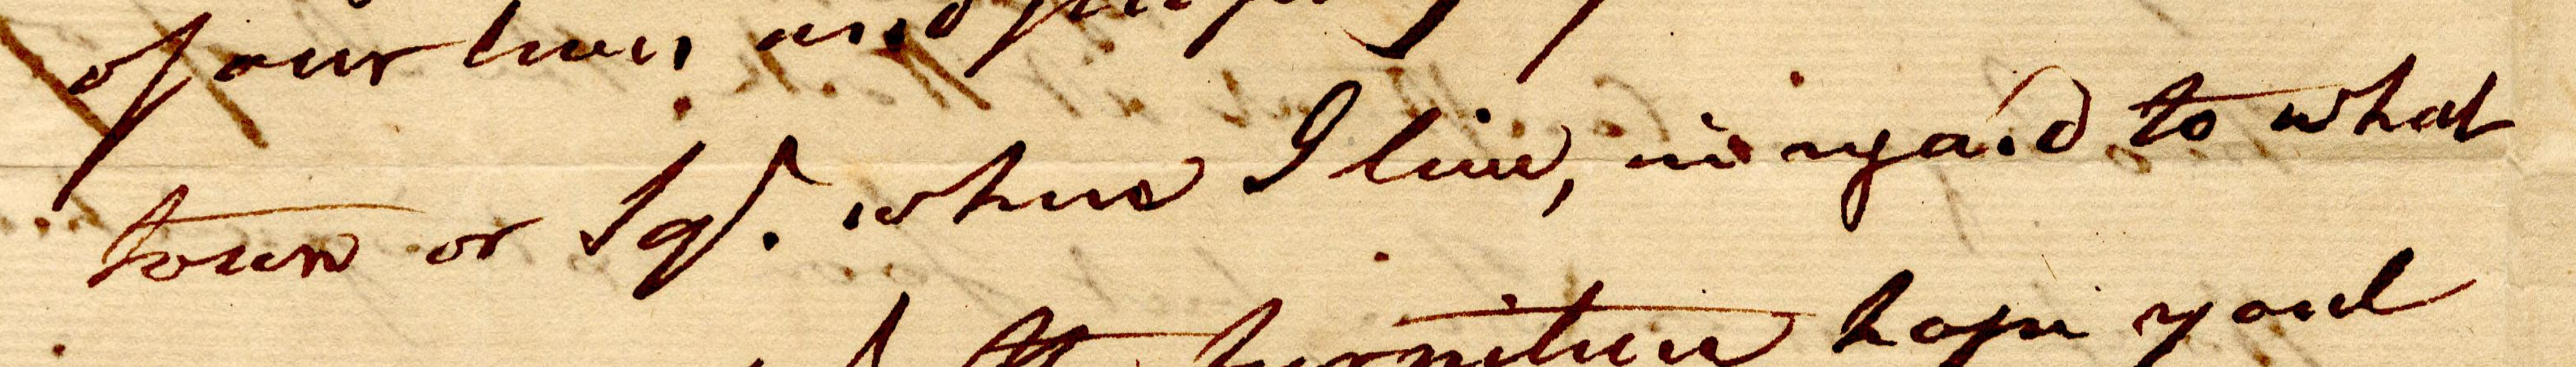town or Sq^r. where I live, in regard to what
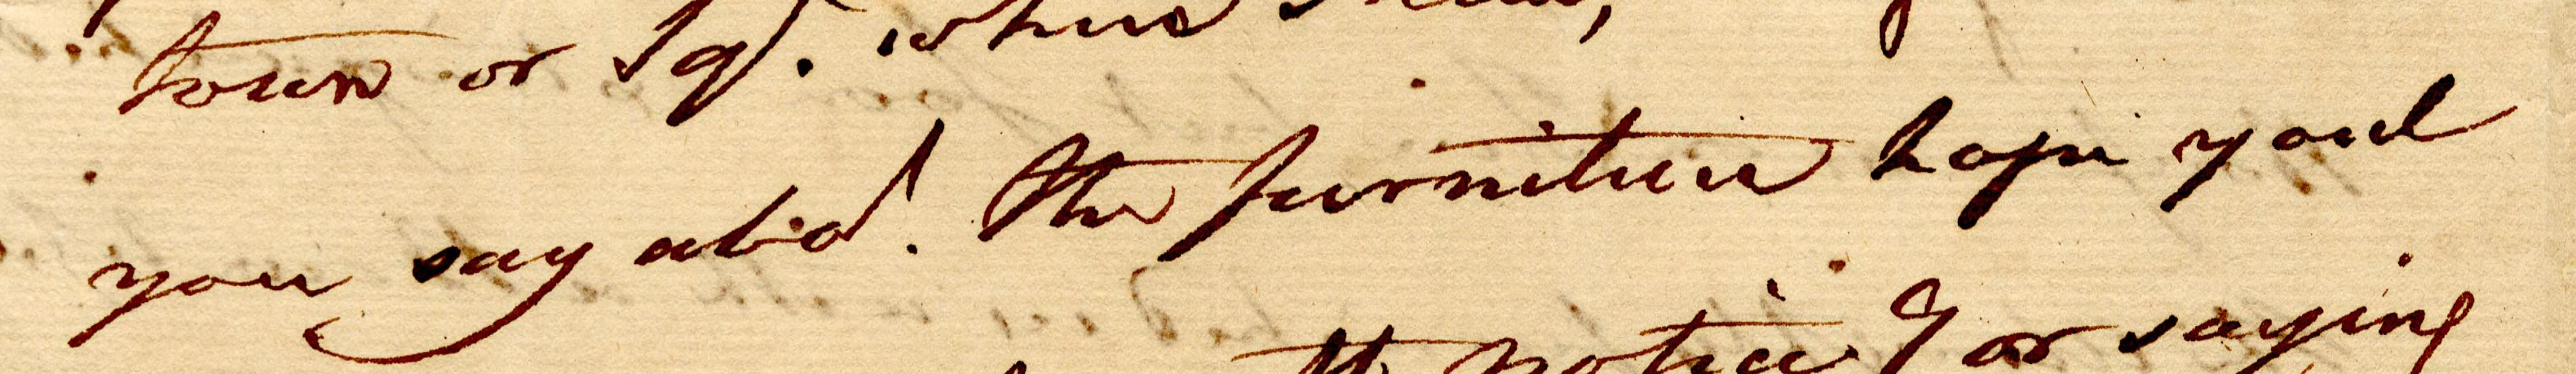you say abo^t. the furniture hope youl
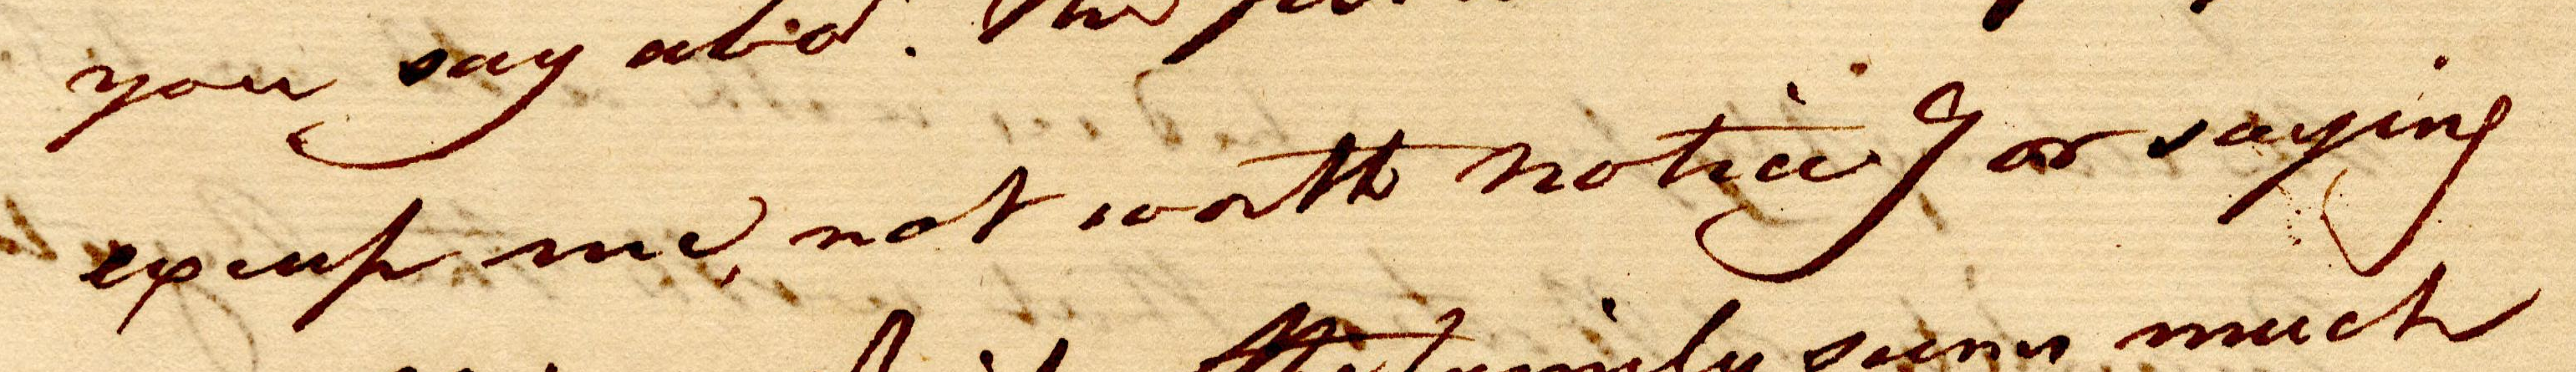excuse me not with notice^g or saying
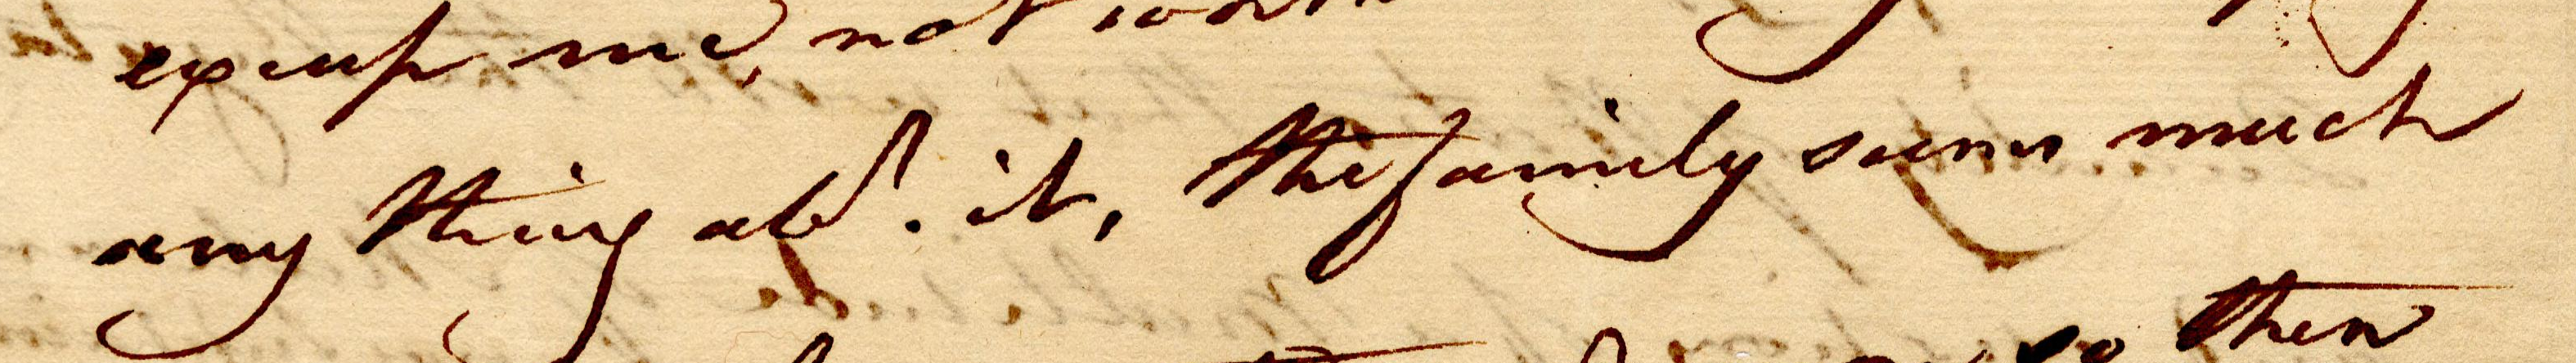any thing ab^t. it, the family seems much
